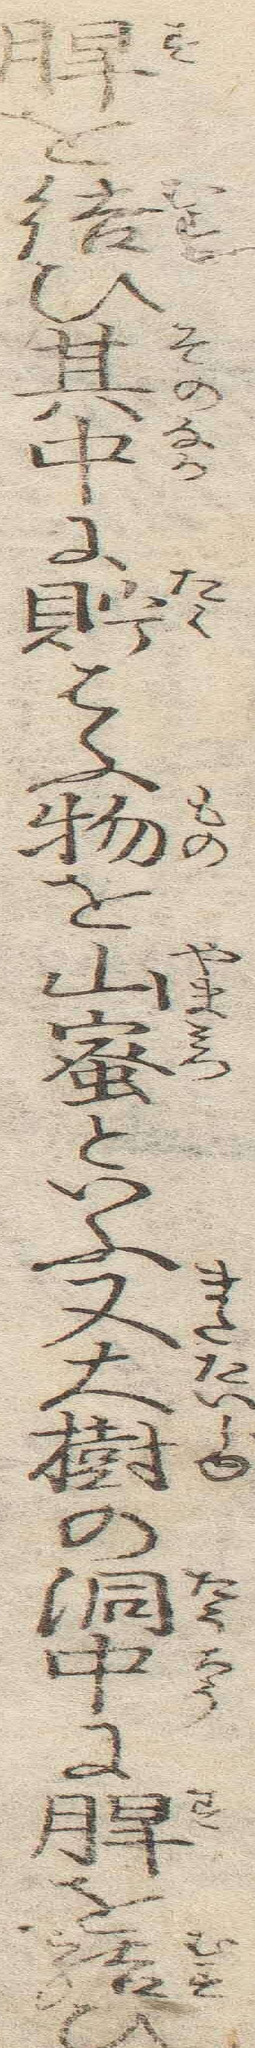脾を結ひ其中に貯はふ物を山蜜といふ又大樹の洞中に脾を結ひ
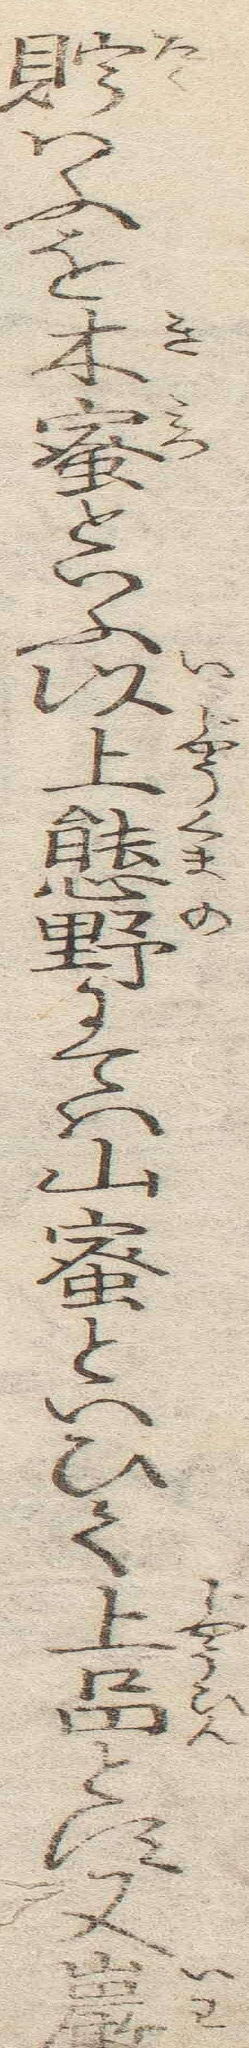貯はふを木蜜といふ以上熊野にては山蜜といひて上品とす又巌
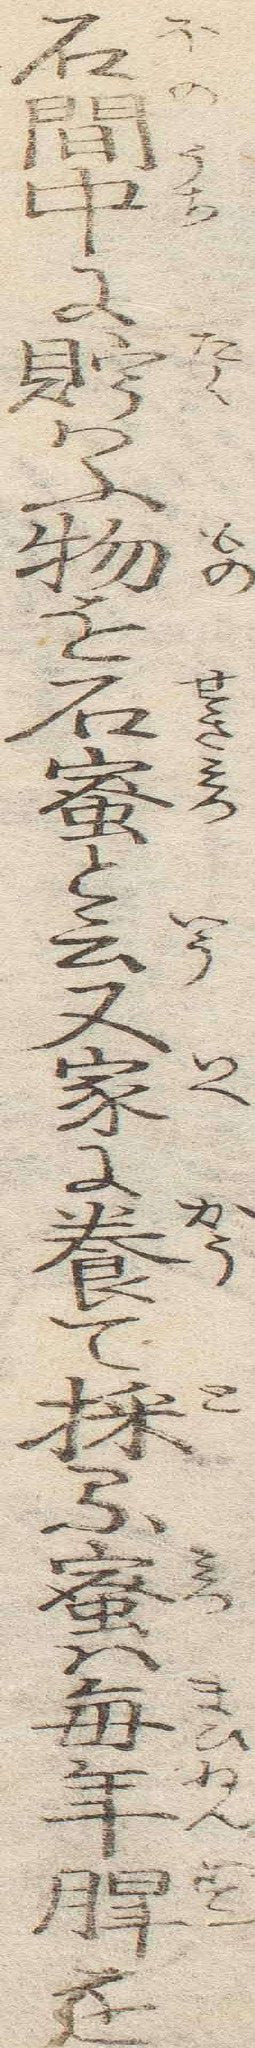石間中に貯はふ物を石蜜と云又家に養て採る蜜は毎年脾を
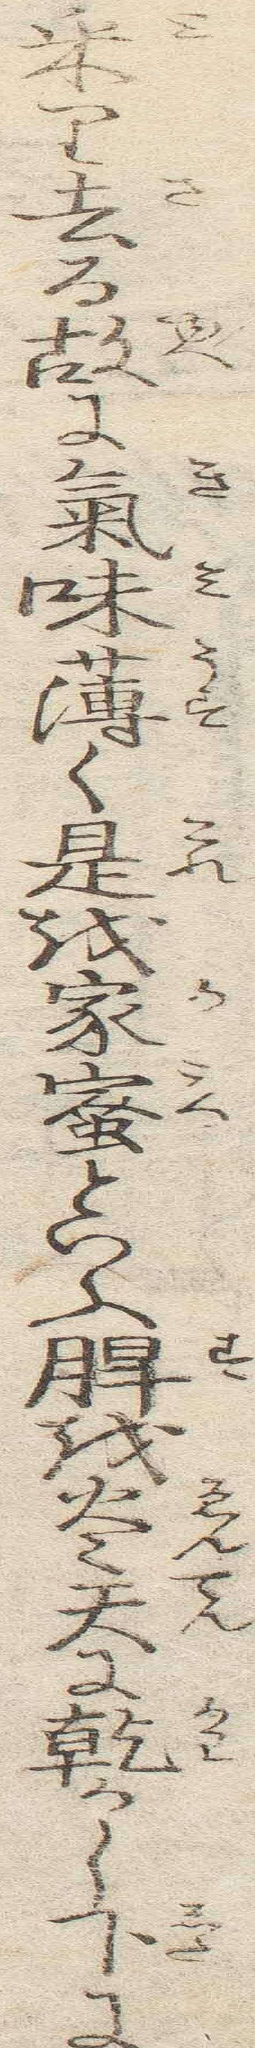采り去る故に気味薄く是を家蜜といふ脾を炎天に乾かし下に
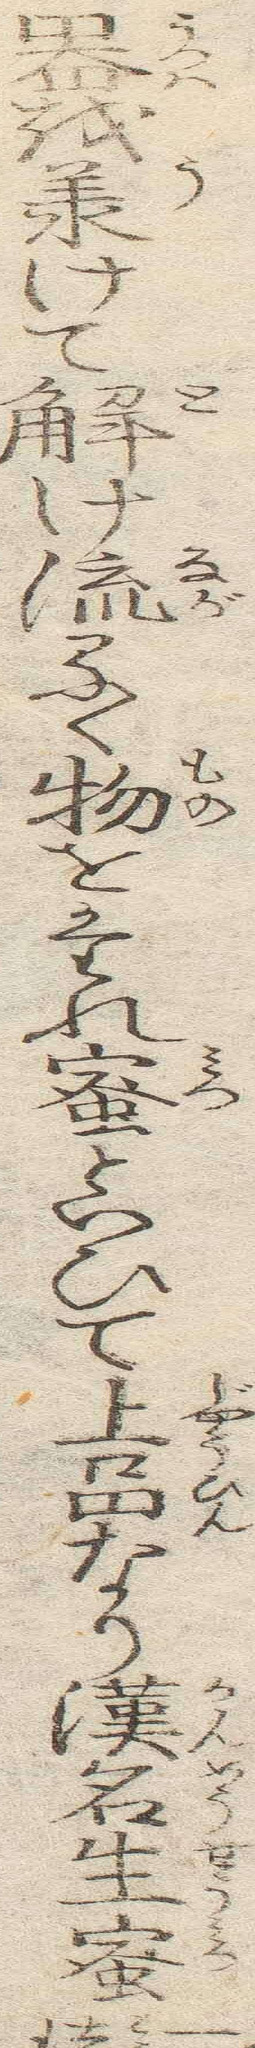器を承けて解け流るゝ物をたれ蜜といひて上品なり漢名生蜜一法
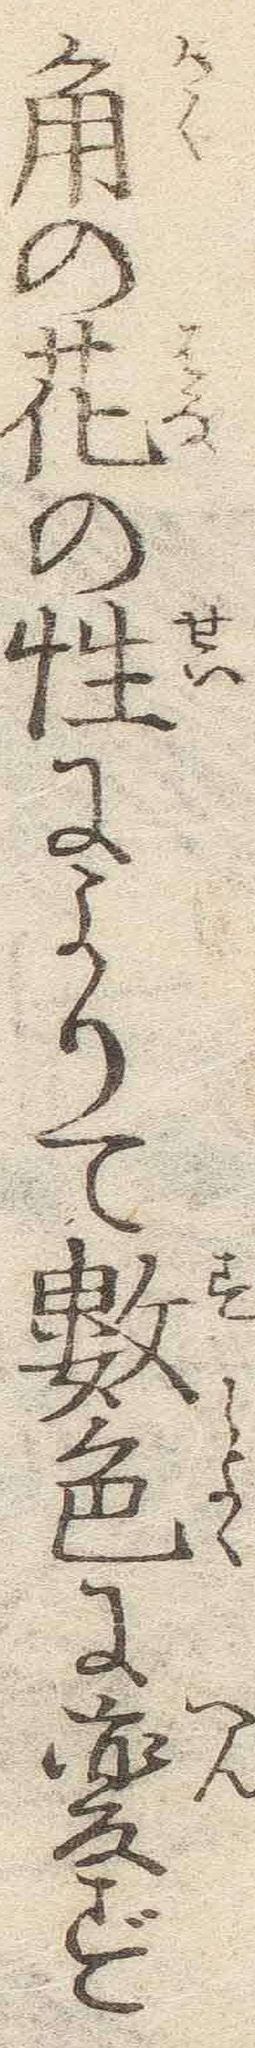角の花の性によりて数色に変ず
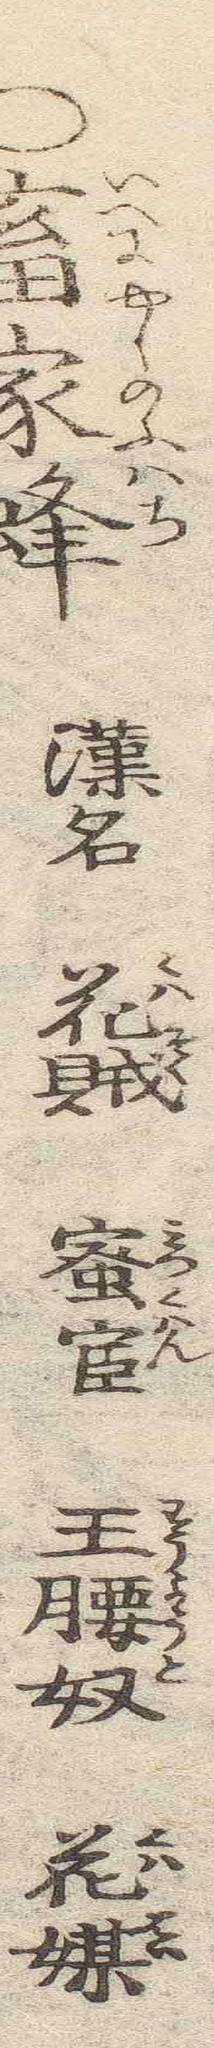○畜家蜂漢名花賊蜜宦王腰奴花媒
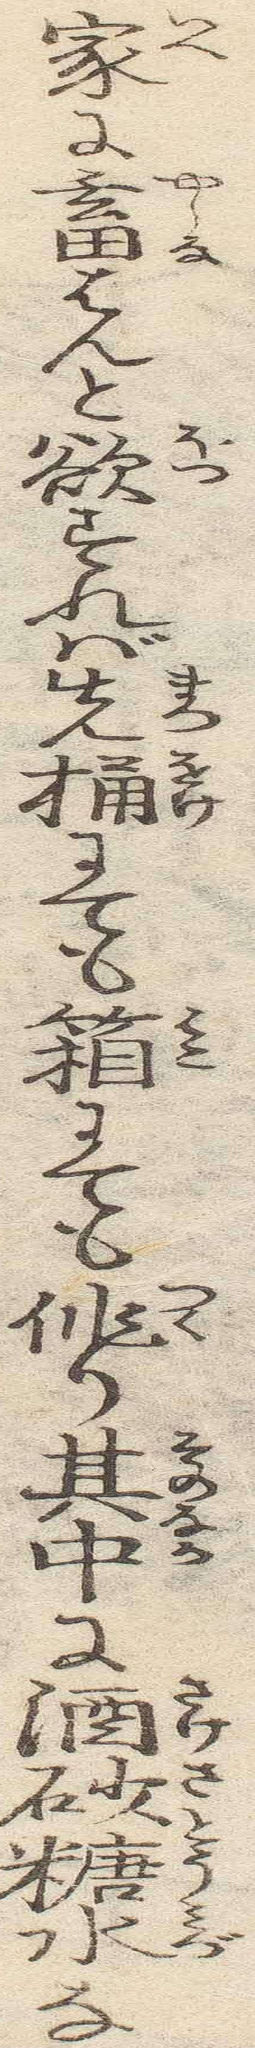家に畜はんと欲すれば先桶にても箱にても作り其中に酒砂糖水な
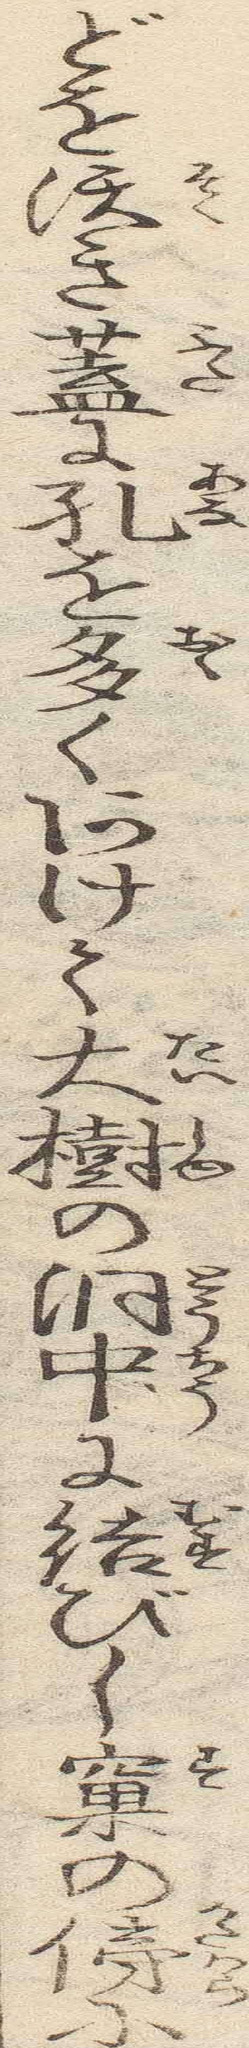どを沃き蓋に孔を多くあけて大樹の洞中に結びし巣の傍に
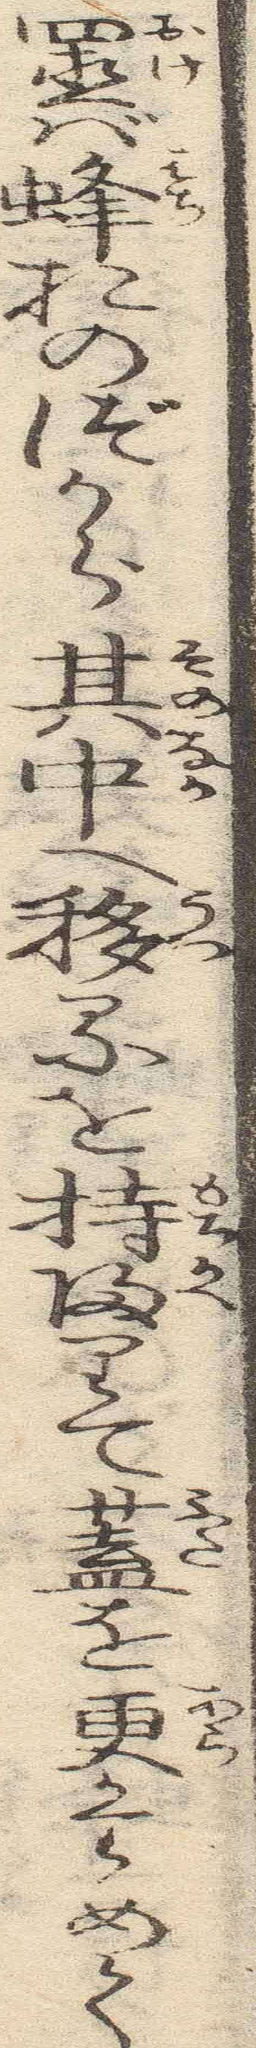置ば蜂おのづから其中へ移るを持帰りて蓋を更ためて
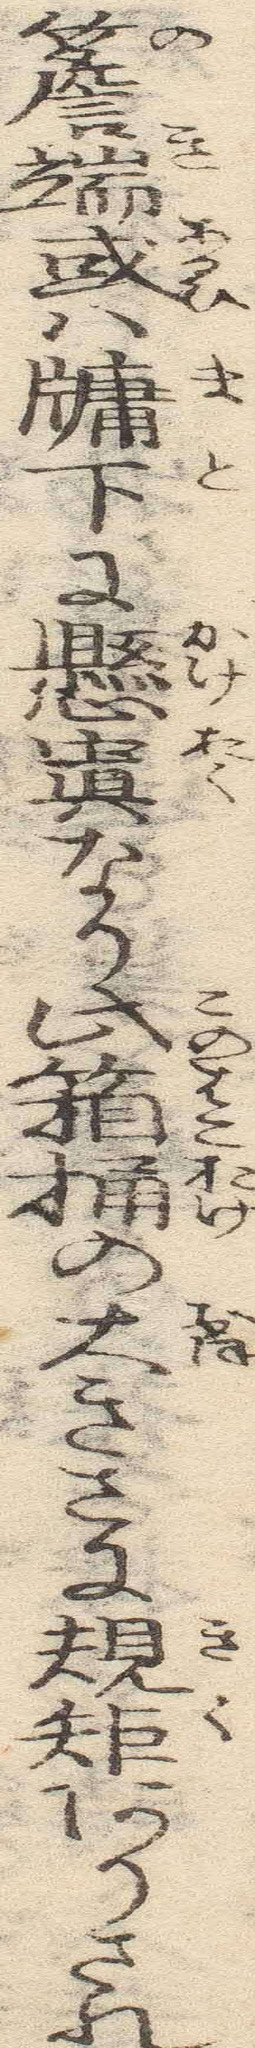簷端或は牗下に懸置なり此箱桶の大きさに規矩ありされ
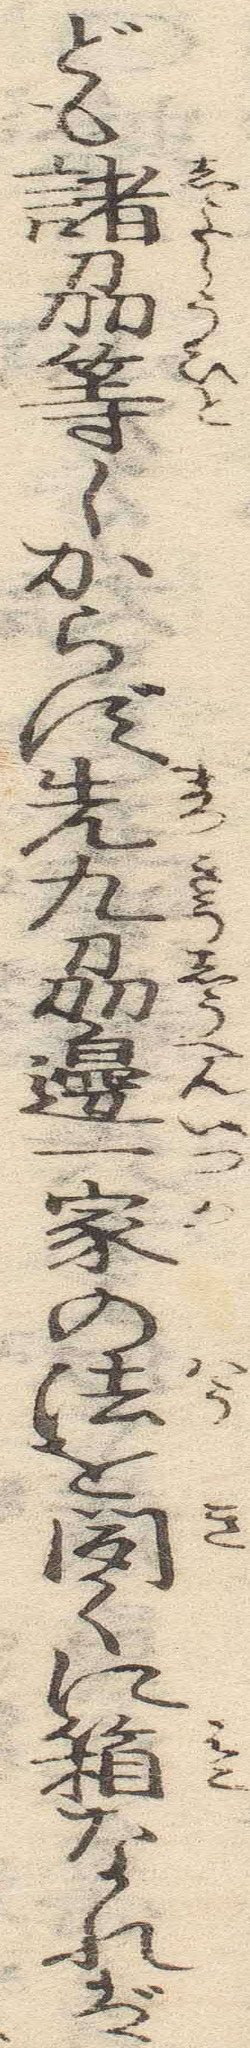ども諸州等しからず先九州辺一家の法を聞くに箱なれば
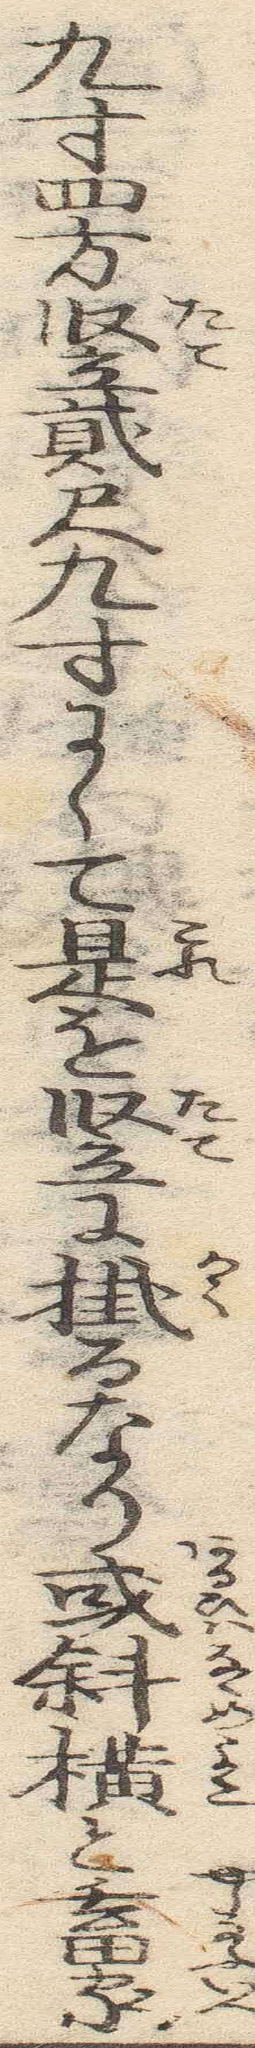九寸四方竪弐尺九寸にして是を竪に掛るなり或斜横と畜家
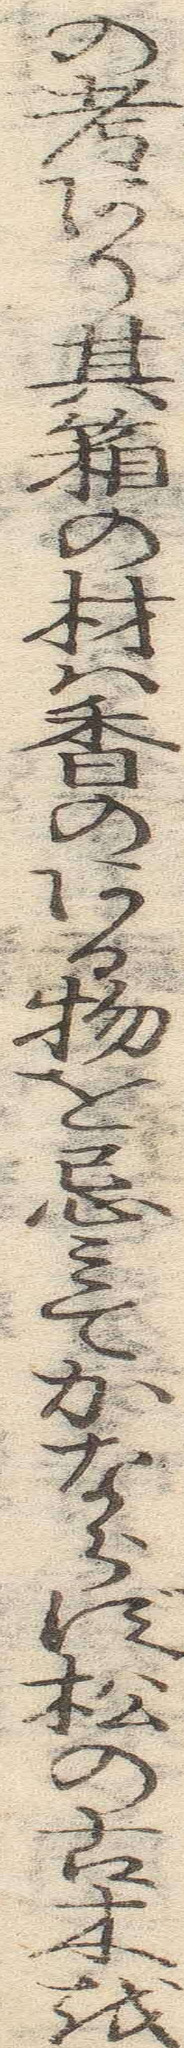の考あり其箱の材は香のある物を忌みてかならず松の古木を
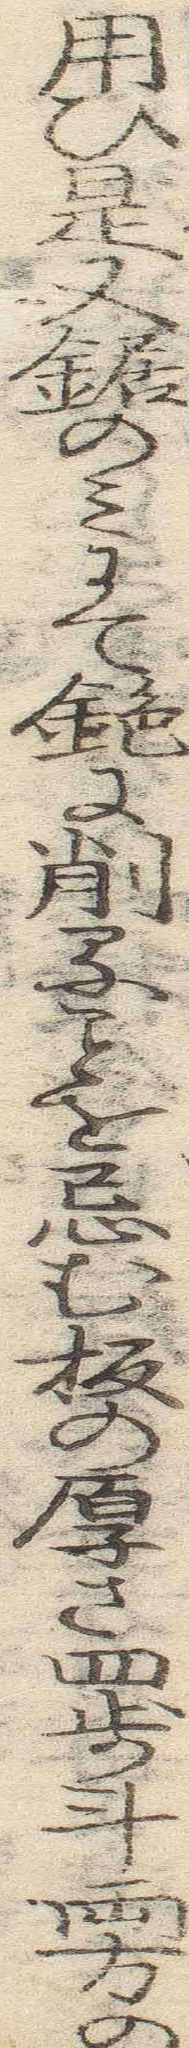用ひ是又鋸のみにて銫に削ることを忌む板の厚さ四歩斗両方の
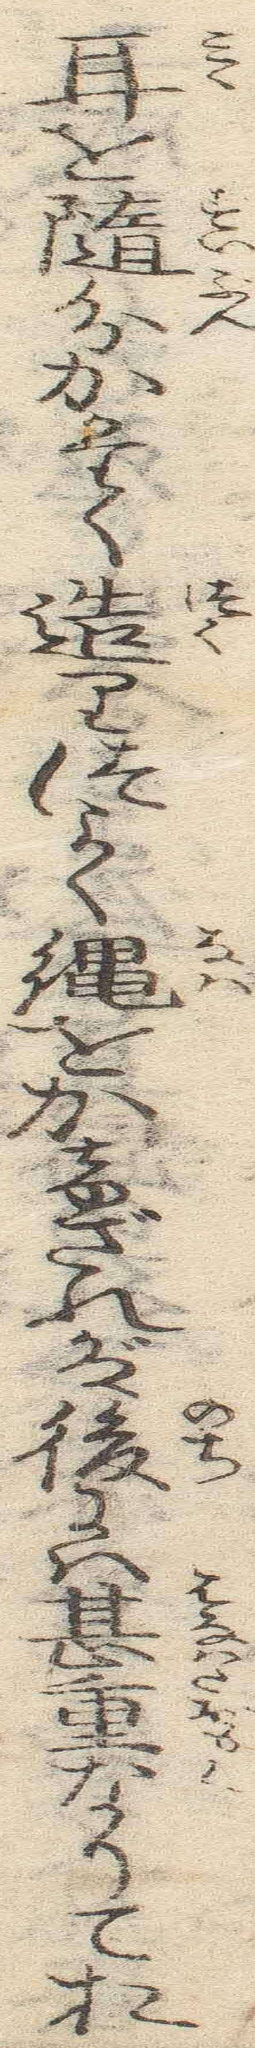耳を随分かたく造りつよく縄をかけざれば後には甚重なりてお
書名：日本山海名産図会
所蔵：東京学芸大学附属図書館 国文学研究資料館
